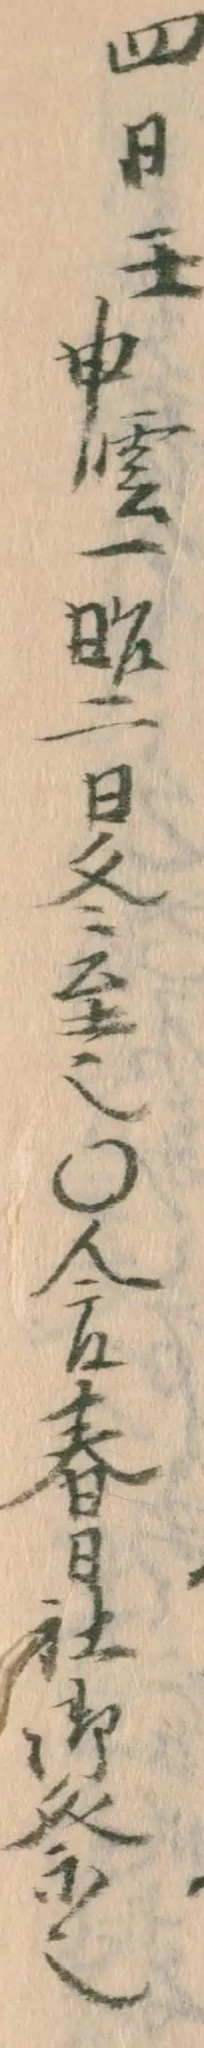四日壬申曇一昨二日冬至也〇今日春日社御祭也
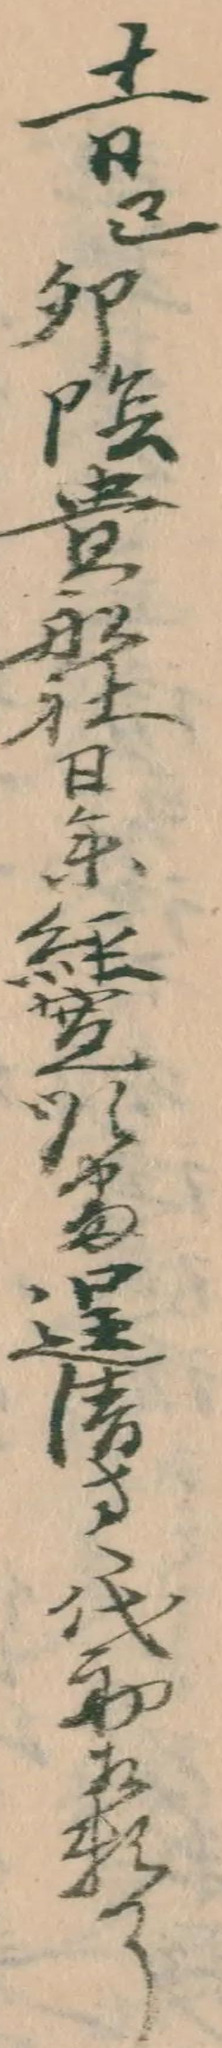十一日己卯陰貴舩社日参経寛順番逞清方へ代勤相頼了
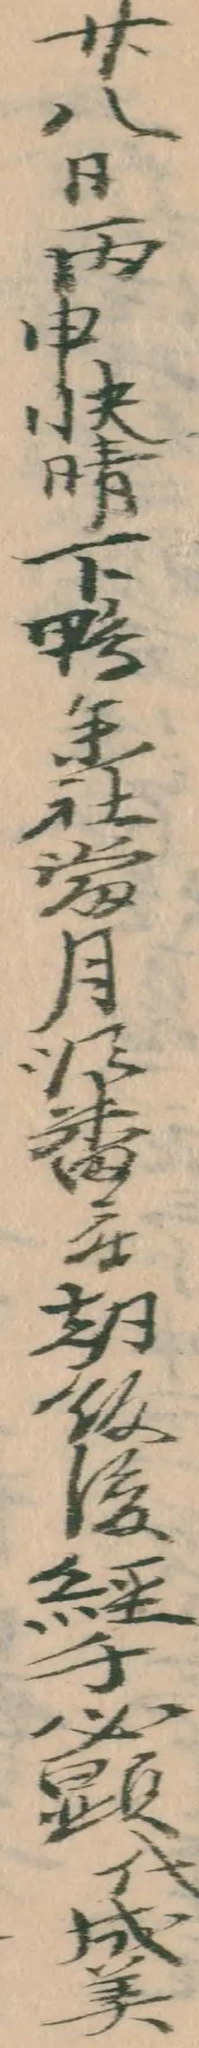廿八日丙申快晴下鴨参社當月順番ニ付朝飯後経千必顕代成美
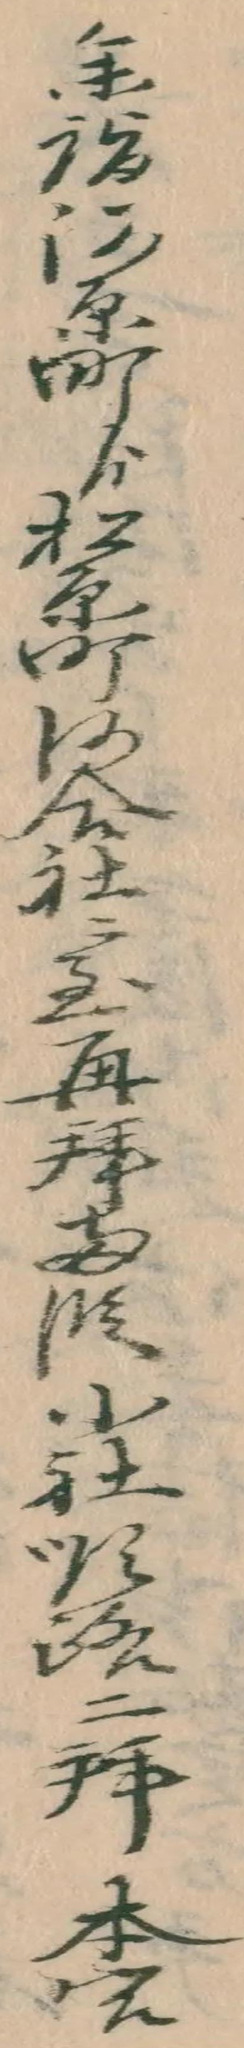参詣河原町ゟ松原町河合社ニ至再拝両段小社順路二拝本宮
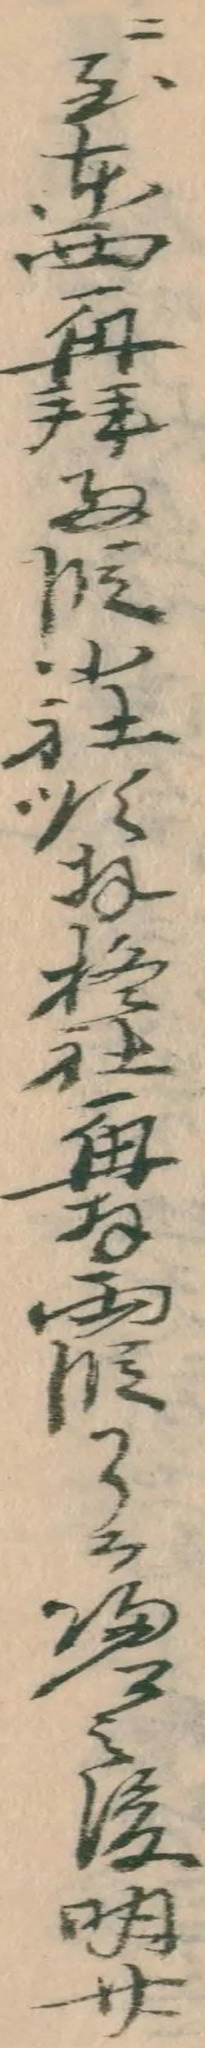ニ至東西再拝両段小社順拝柊社再拝両段了而帰郷之後明廿
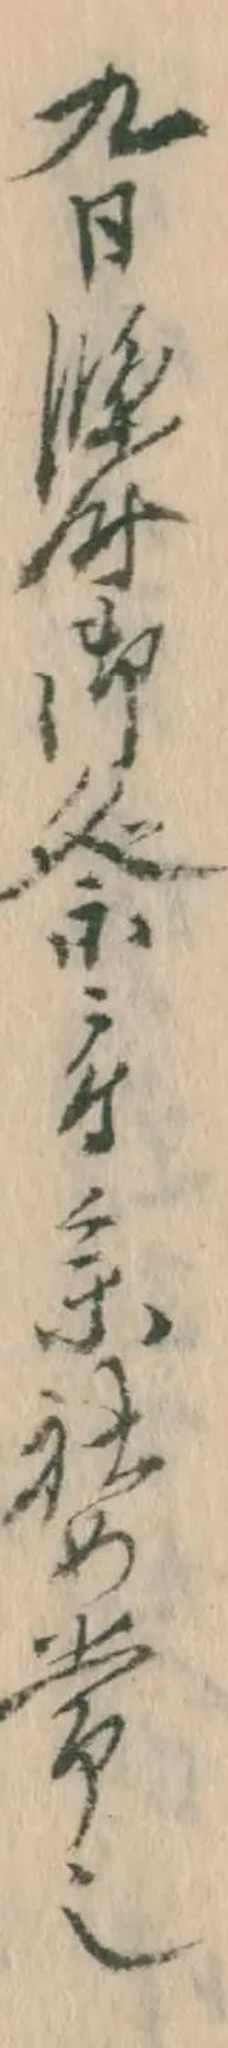九日臨時御祭ニ付参社如常也
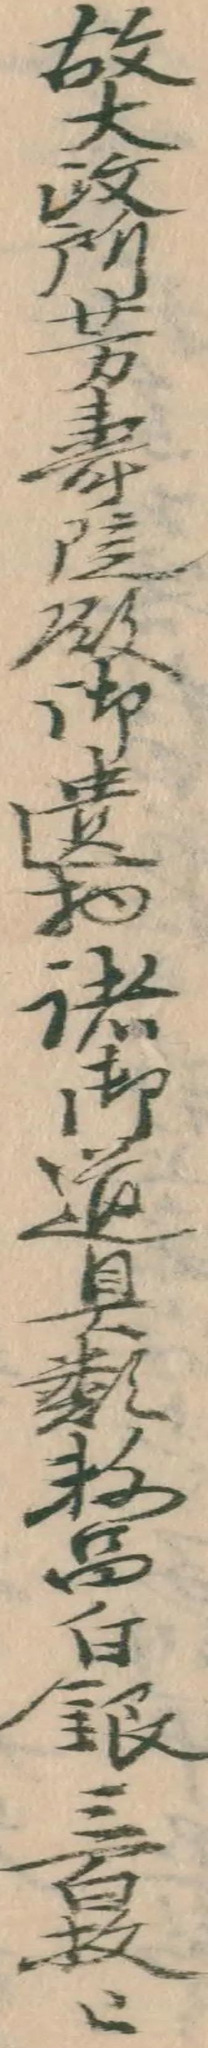故大政所芳壽院殿御遺物諸御道具類数品白銀三百枚被
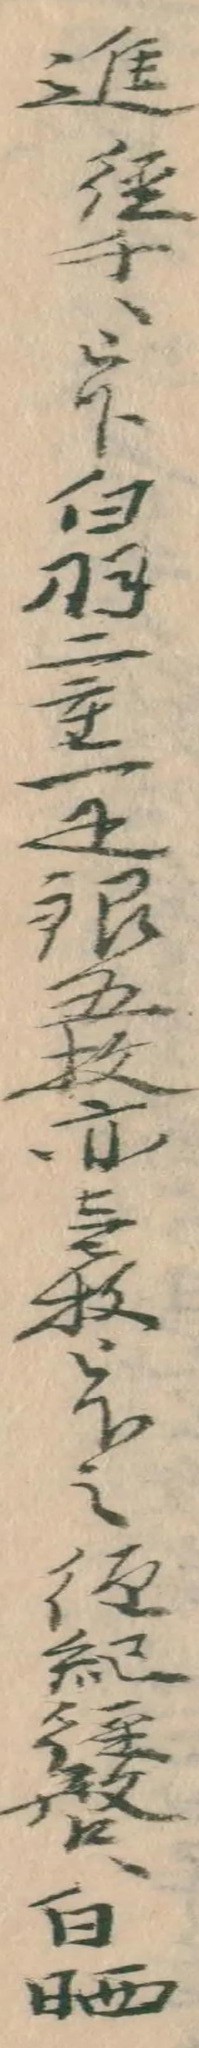進経千へ被下白羽二重一疋銀五枚亦壱枚被下也経起経啓ヘ白晒
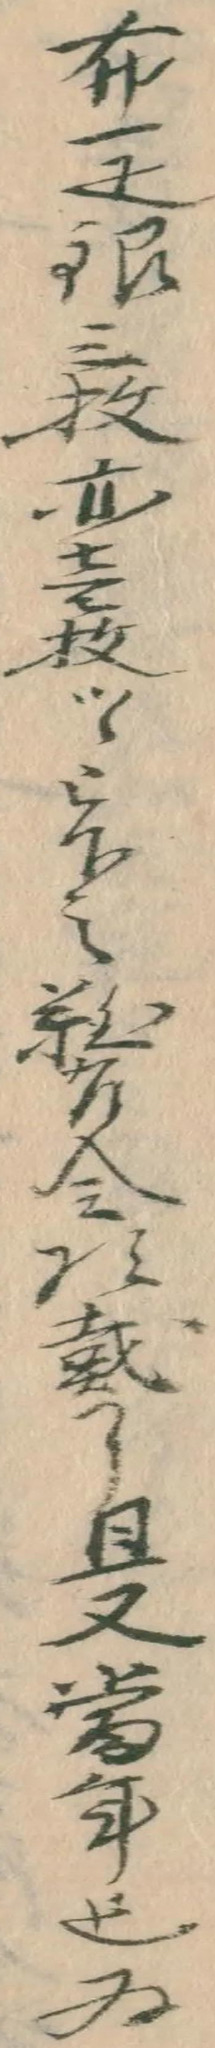布疋銀三枚亦壱枚ツヽ被下也難有令頂戴了且又當年迄為
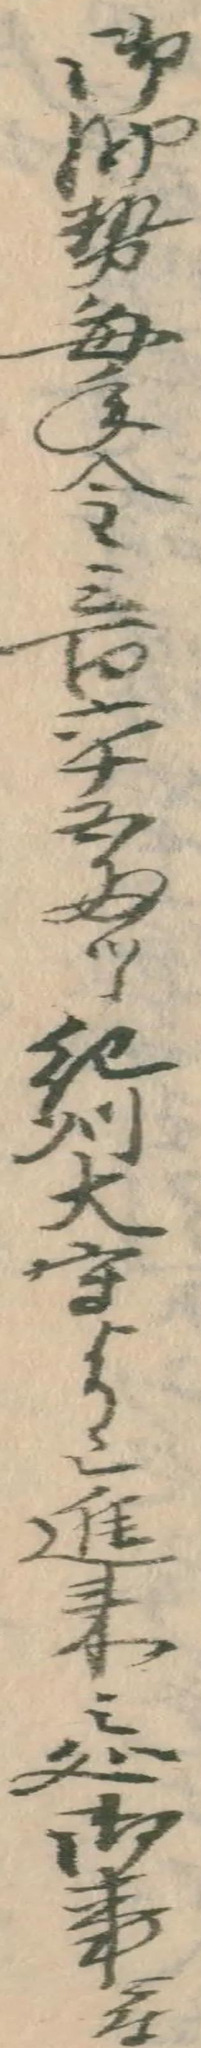御助勢毎年金三百六十五両ツヽ紀州大宮より已来之処御事ニ付
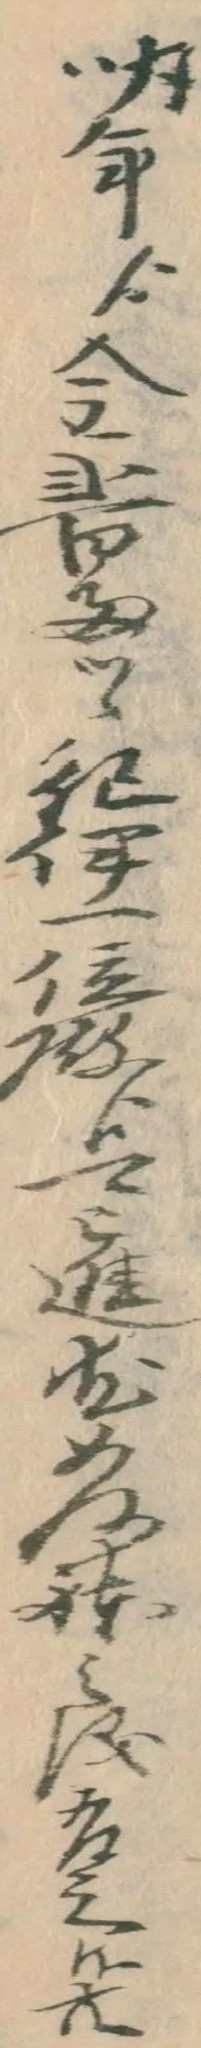明年ゟ金弐百両ツヽ紀伊一位殿ゟ可被進尤如何躰之儀有之候共
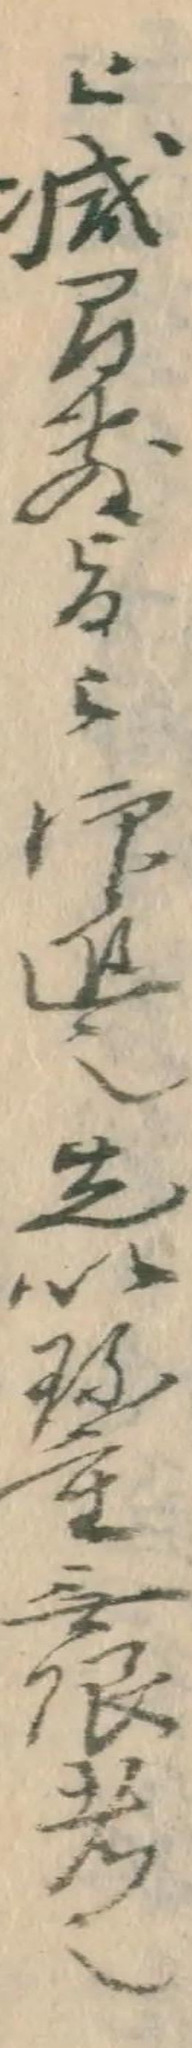被減間敷旨被仰進之先以珍重無限者也
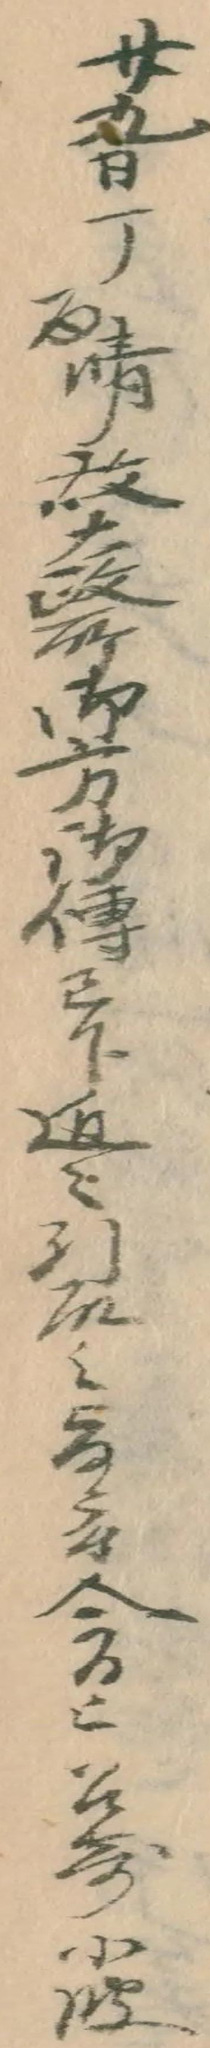廿九日丁酉晴故大政所御方御傳已下近々引取之旨ニ付今日被召寄小波

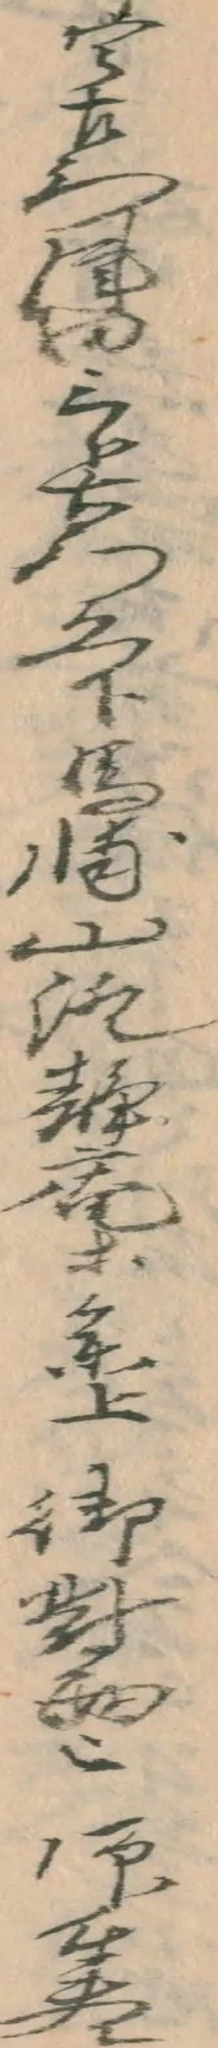宇左衛門津田三郎右衛門久下馬輔山路静庵等参上御對面被仰付為
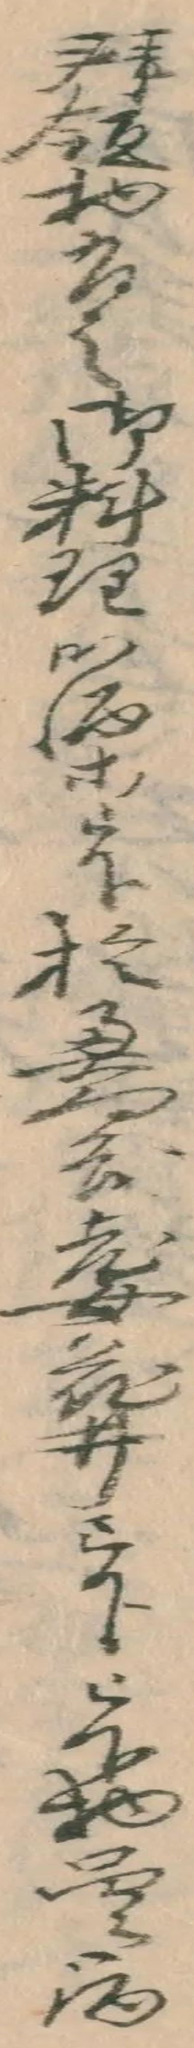拝領物有之御料理御酒等被下於奥向節老女亀井已下被下物品々御酒
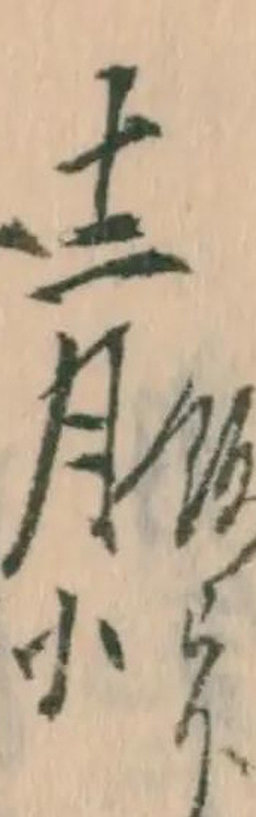十二月小
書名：賀茂社記録. 第69冊
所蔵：国立国会図書館 National Diet Library, JAPAN
